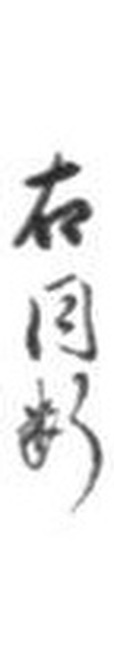右同断
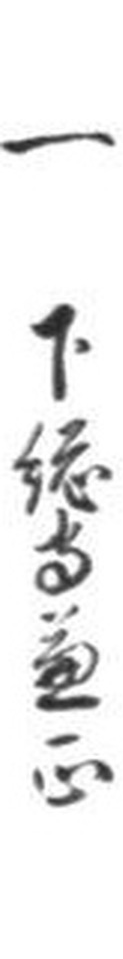一下総守兼正
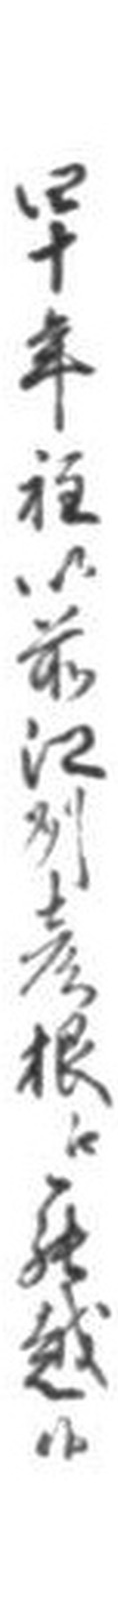四十年程以前江州彦根江罷越候
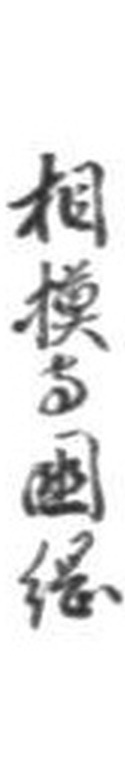一相模守国綱
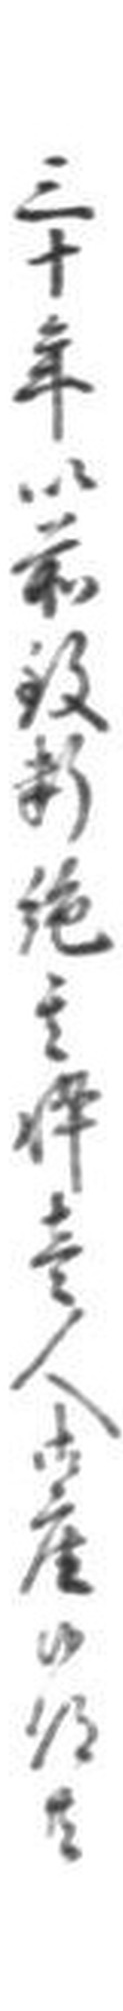三十年以前致断絶其忰壱人御座候得共
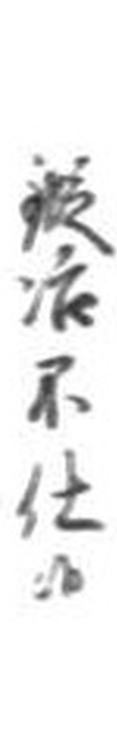鍛冶不仕候
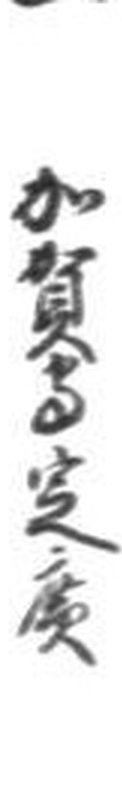一加賀守定広
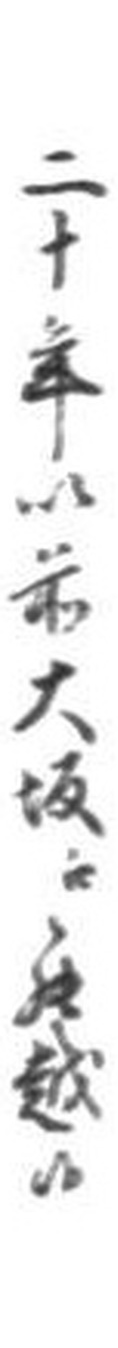二十年以前大坂江罷越候
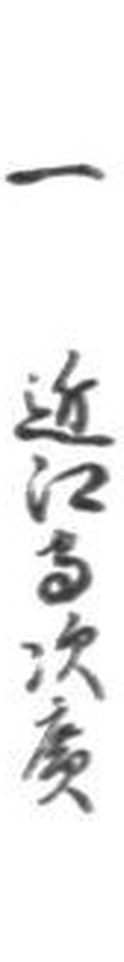一近江守次広
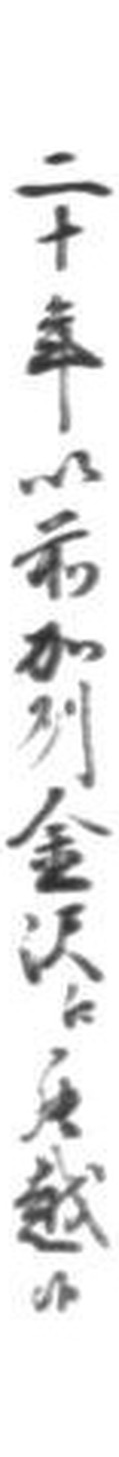二十年以前加州金沢江罷越候
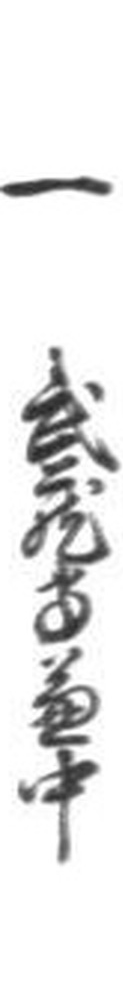一武蔵守兼中

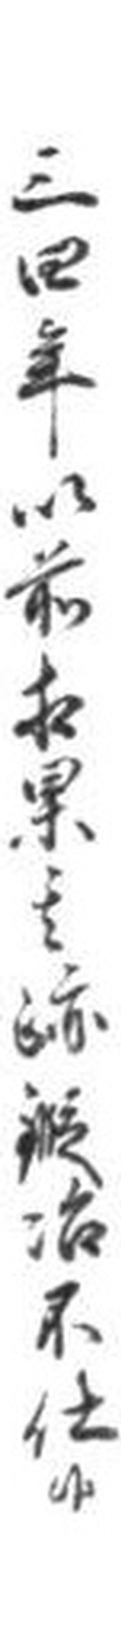三四年以前相果其跡鍛冶不仕候
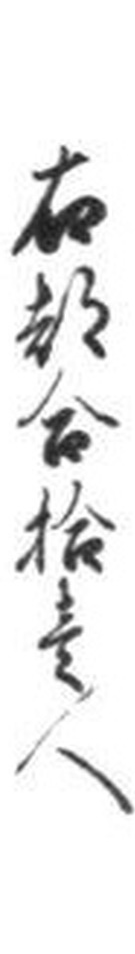右都合拾壱人
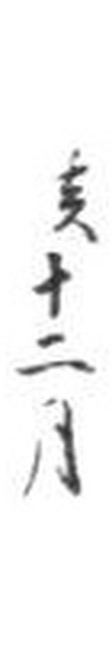亥十二月
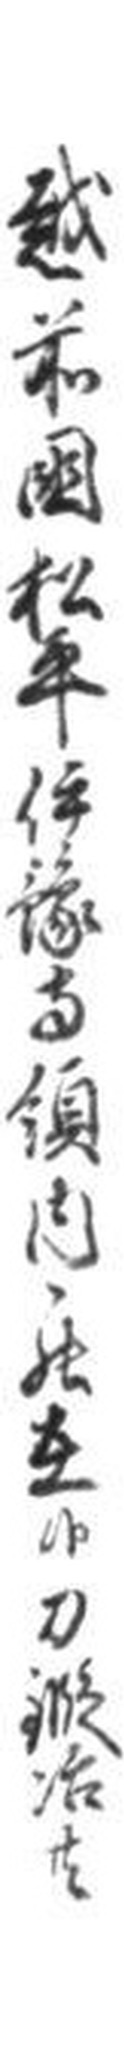越前国松平伊予守領内罷在候刀鍛冶共
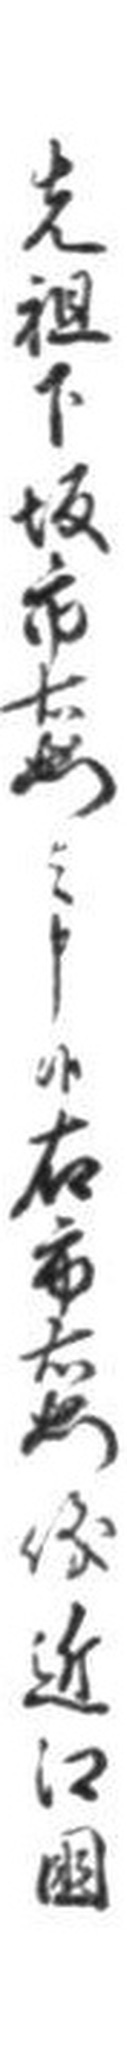先祖下坂市右衛門与申候右市右衛門儀近江国
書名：家譜 三十三 吉邦公 享保四年
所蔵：福井県文書館 Fukui Prefectural Archives
